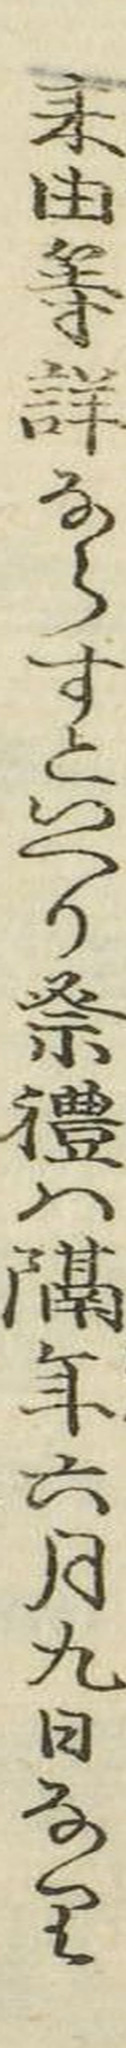来由等詳ならすといへり祭礼は隔年六月九日なり
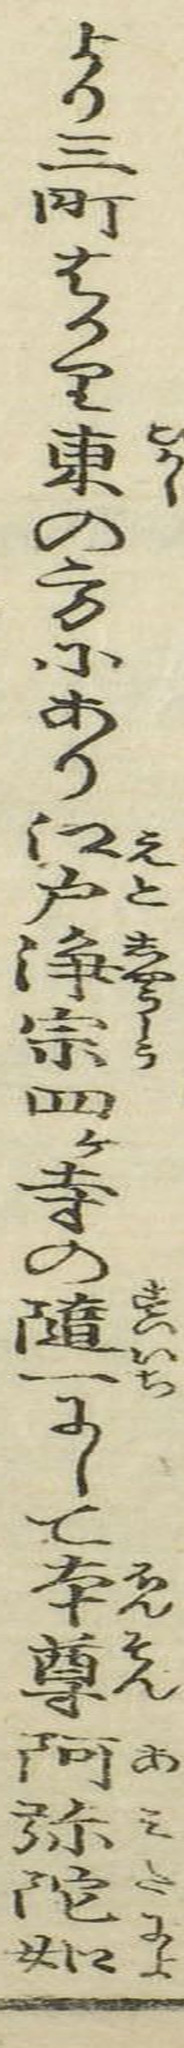より三町はかり東の方にあり江戸浄宗四ヶ寺の随一にして本尊阿弥陀如
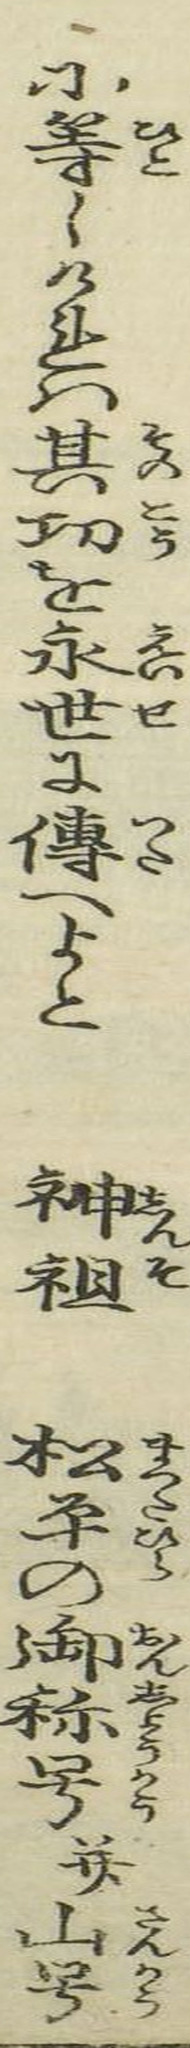に等しけれは其功を永世に伝へよと神祖松平の御称号并山号
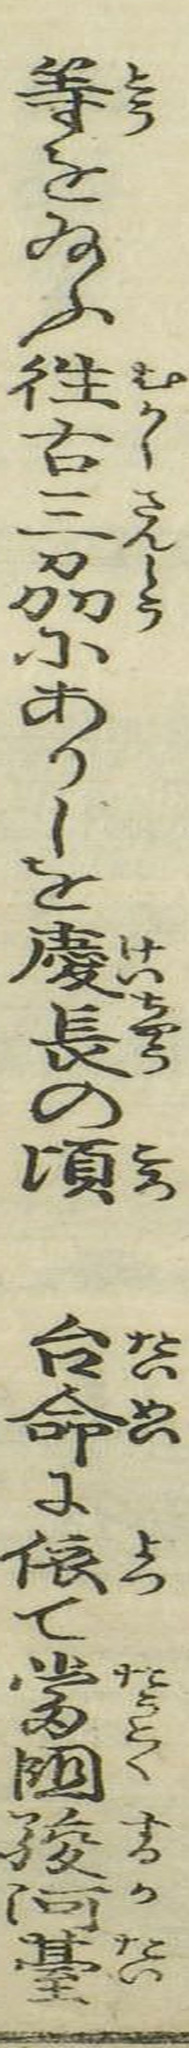等を給ふ往古三州にありしを慶長の頃台命に依て当国駿河台
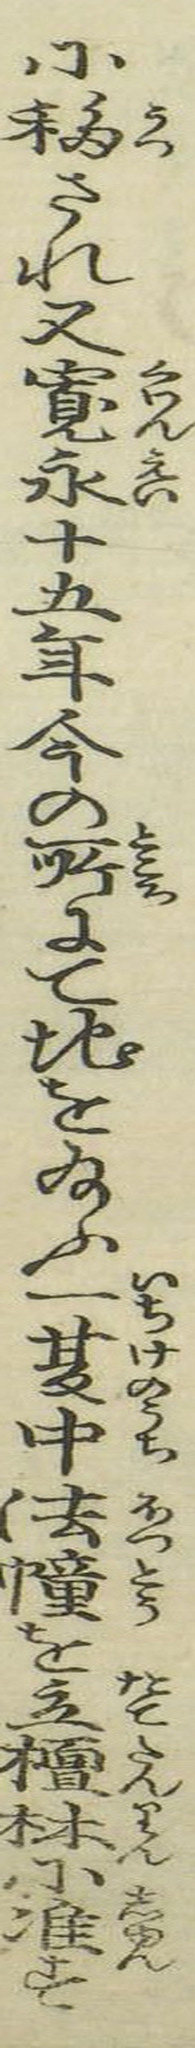に移され又寛永十五年今の所にて地を給ふ一夏中法幢を立檀林に准す

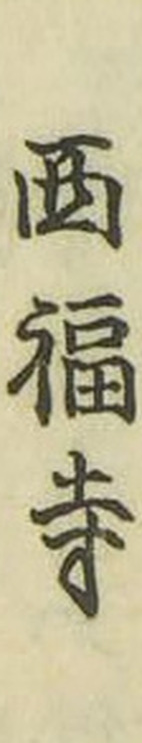西福寺

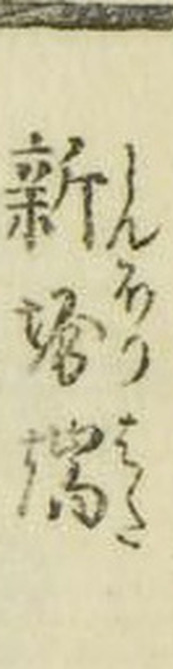新堀端
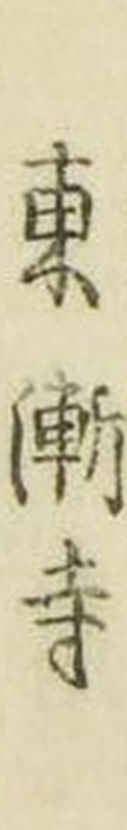東漸寺
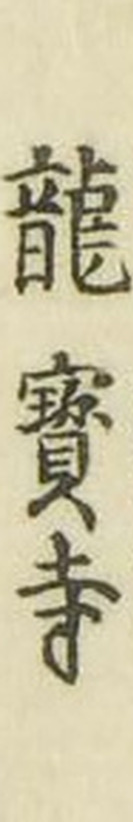龍宝寺
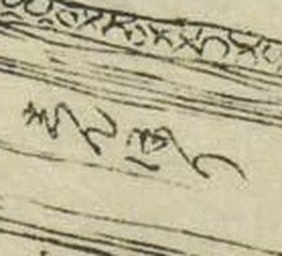しんほり
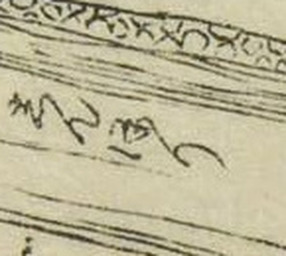しんほり
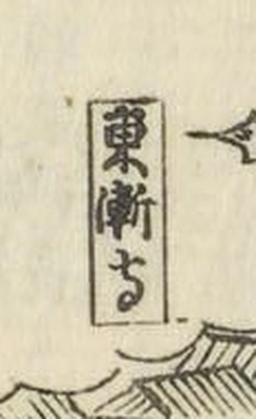東漸寺
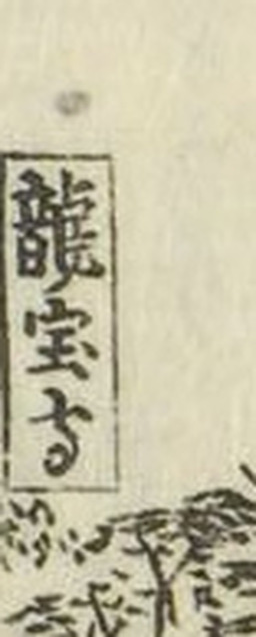龍宝寺

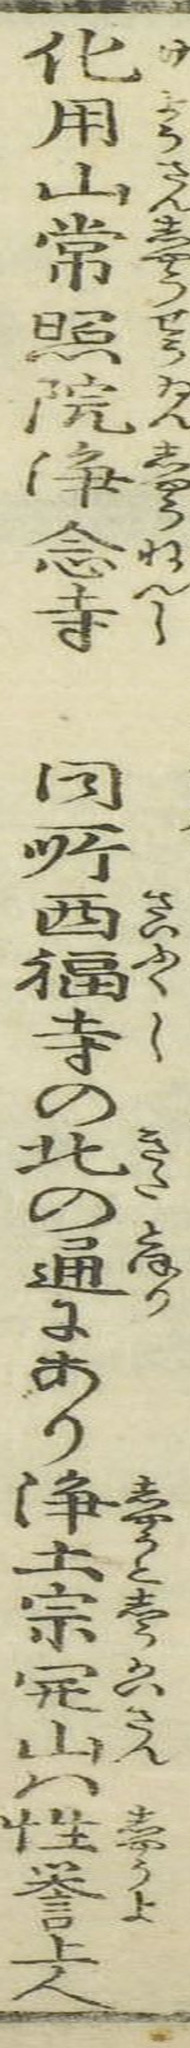化用山常照院浄念寺同所西福寺の北の通にあり浄土宗開山は性誉上人
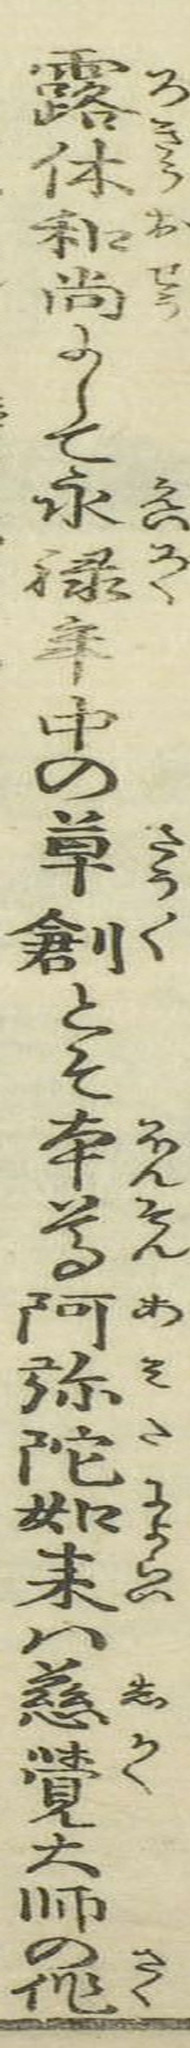露休和尚にして永禄年中の草創とそ本尊阿弥陀如来は慈覚大師の作
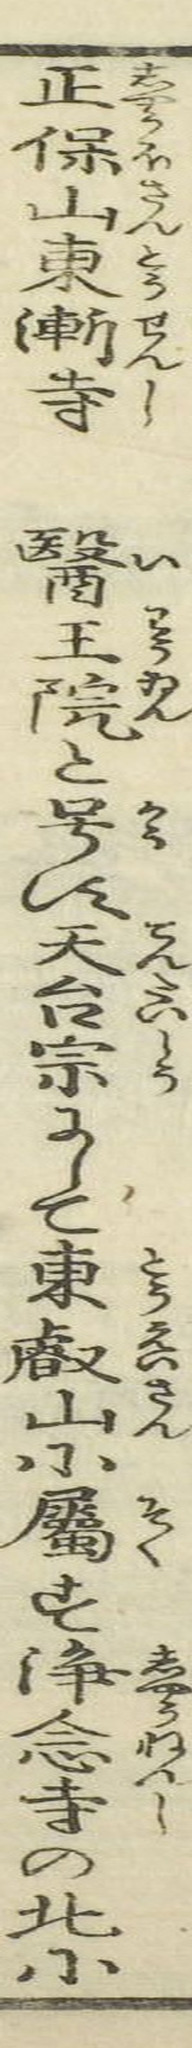正保山東漸寺医王院と号す天台宗にして東叡山に属す浄念寺の北に
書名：江戸名所図会 20巻 巻之16
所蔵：東京学芸大学教育コンテンツアーカイブ
